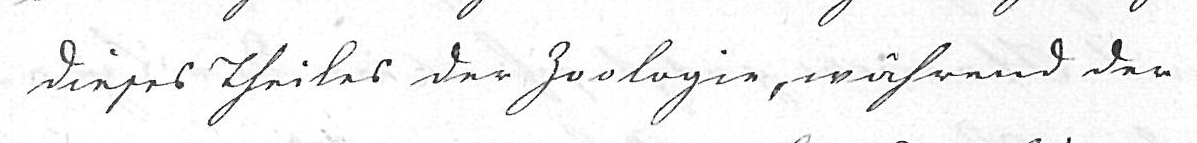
dieses Theiles der Zoologie, während der
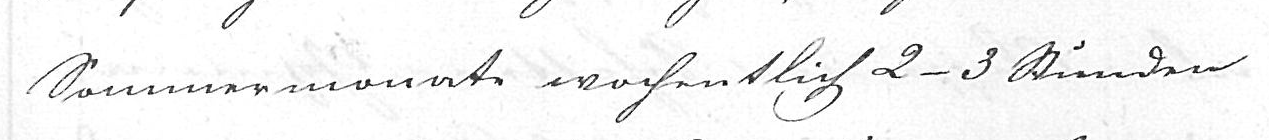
Sonmermonate wochentlich 2-3 Stunden
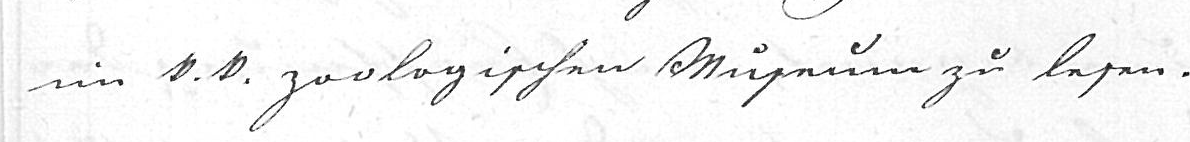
im k. k. zoologischen Museum zu lesen.
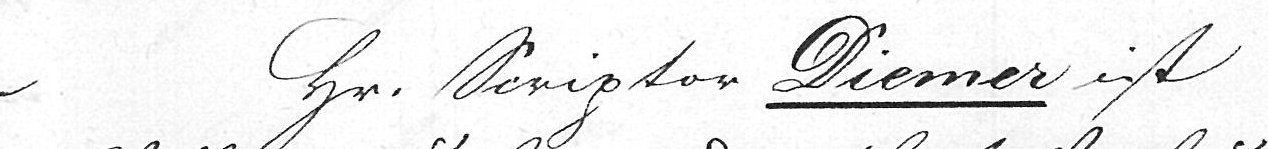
Hr. Scriptor Diemer ist
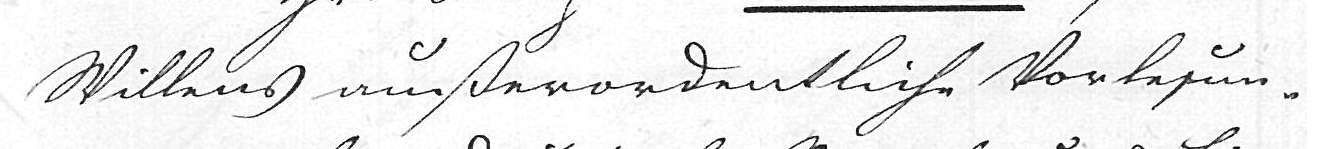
Willens außerordentliche Vorlesun-
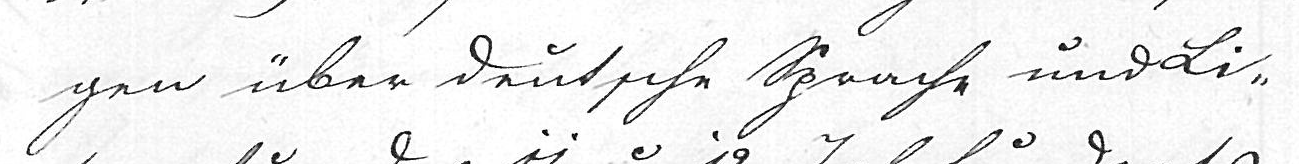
gen über deutschen Sprache und Li-
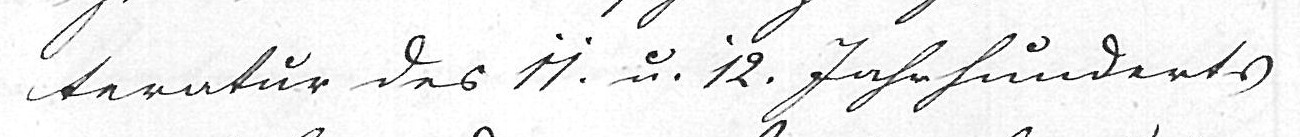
teratur des 11. u. 12. Jahrhunderts
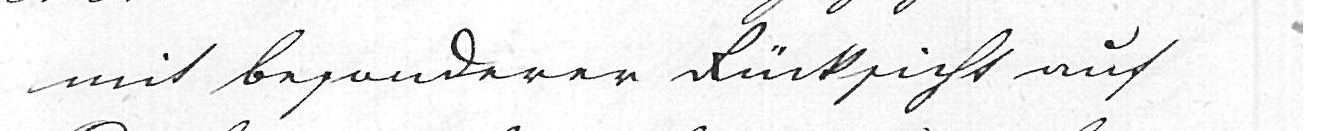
mit besonderer Rücksicht auf
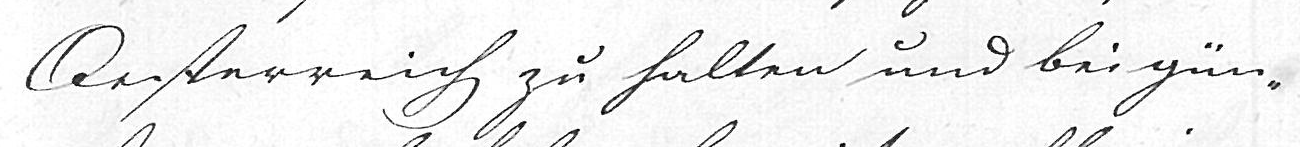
Oesterreich zu halten und bei gün-
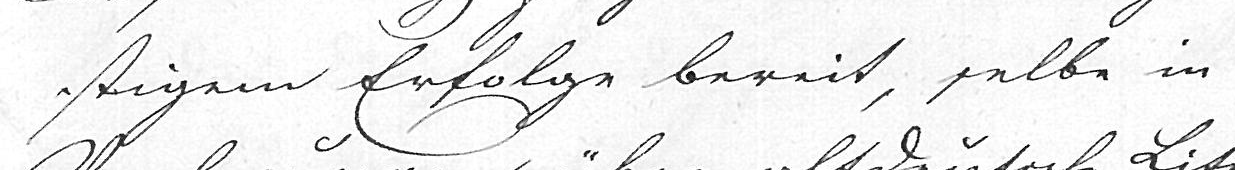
stigem Erfolge bereit, selbe in
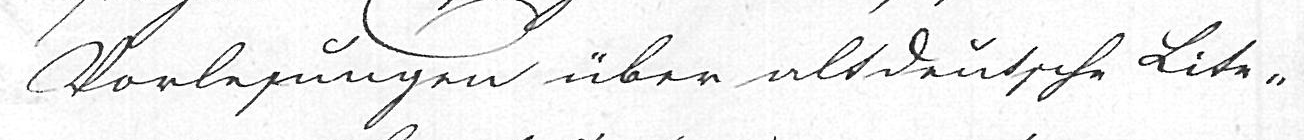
Vorlesungen über altdeutsche Lite-
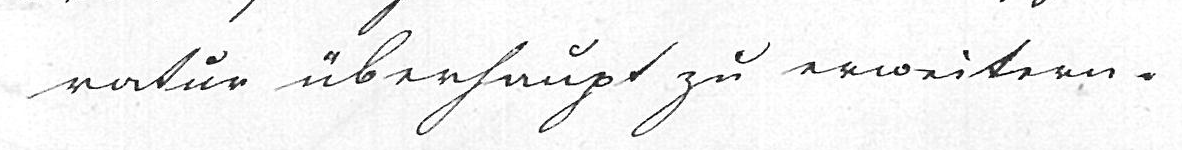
ratur überhaupt zu erweitern.
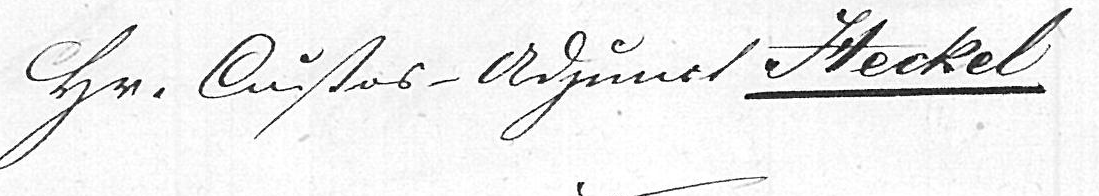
Hr. Custos-Adjunct Heckel
